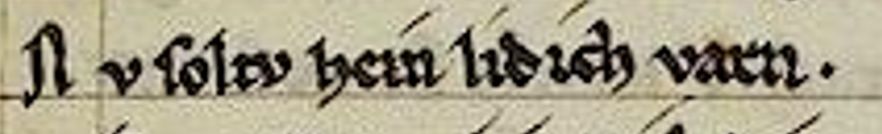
Nv ſoltv hein lidich varn.
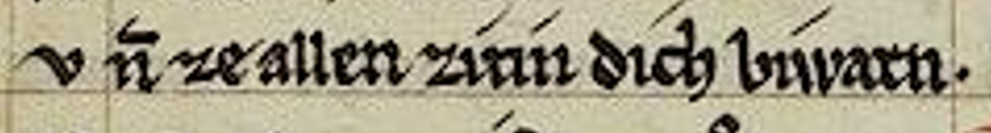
Vn(d) ze allen zitin dich biwarn.
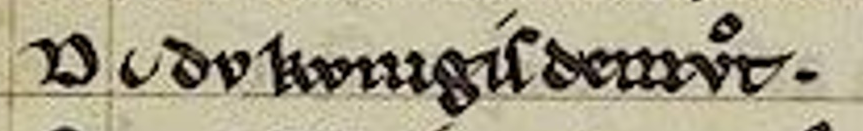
D(az) dv kvnigiſ demv°ot.
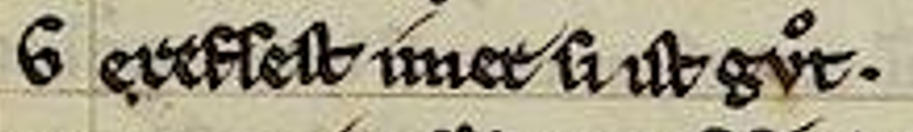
Gerefſeſt imer ſi iſt gv°ot.
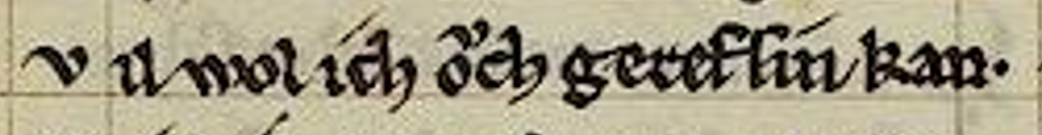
Vil wol ich o°vch gerefſin kan.
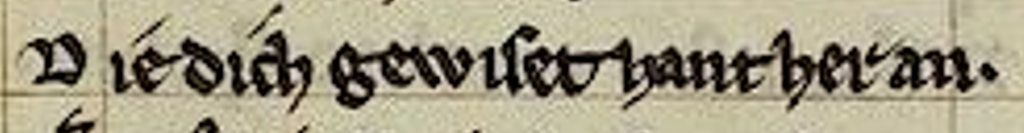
Die dich gewiſet hant her an.
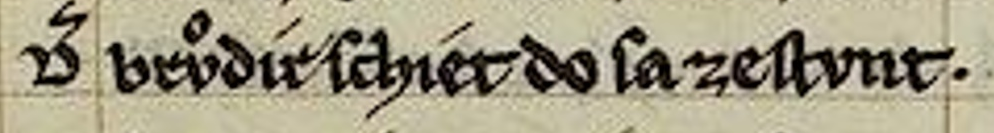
D(er) brv°odir ſchiet do ſa zeſtvnt.
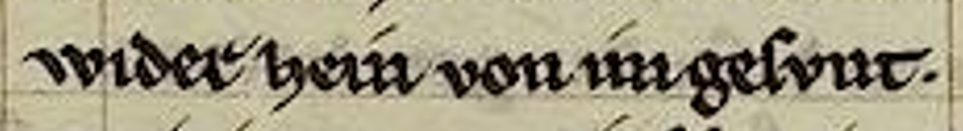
Wider hein von im geſvnt.
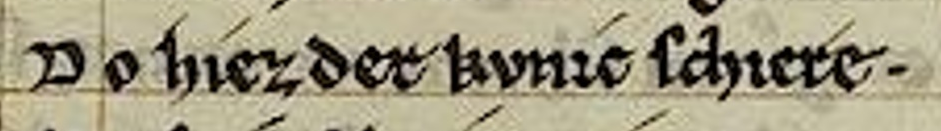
Do hiez der kvnic ſchiere.
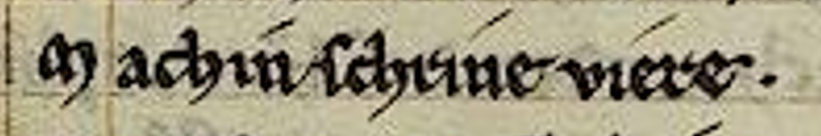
Machin ſchrine viere.
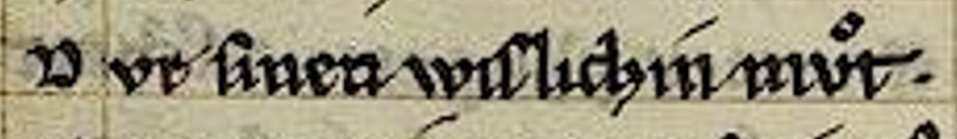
Dvr ſinen wiſlichin mv°ot.
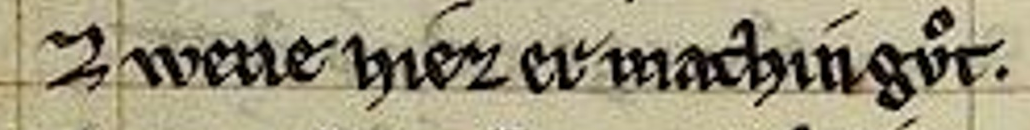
Zwene hiez er machin gv°ot.
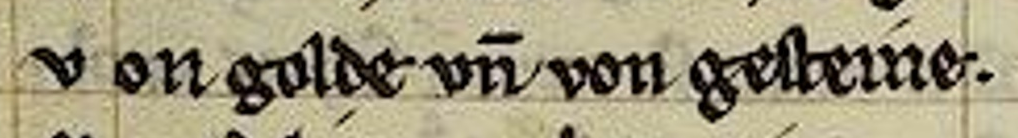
Von golde vn(d) von geſteine.
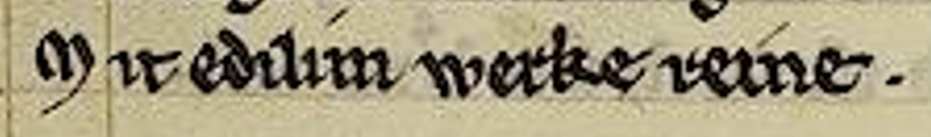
Mit edilim werke reine.
